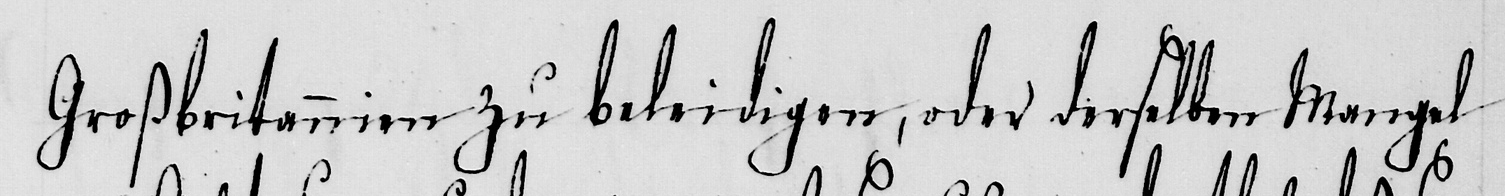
Großbritannien zu beleidigen, oder derselben Mangel
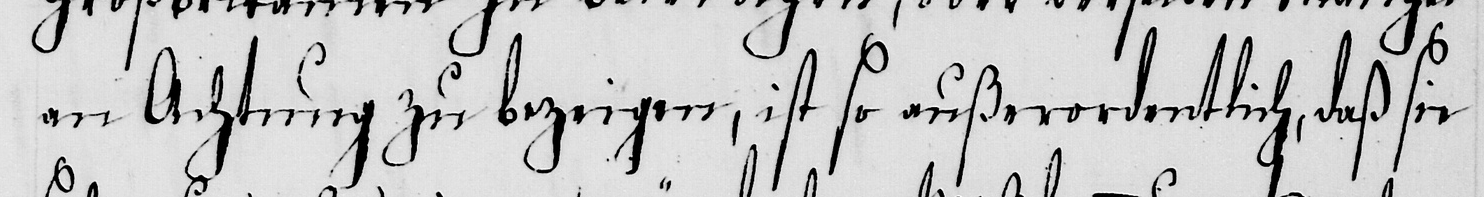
an Achtung zu bezeigen, ist so außerordentlich, daß sie
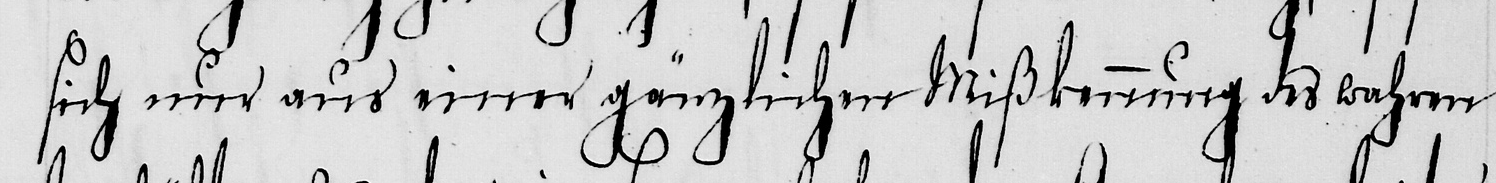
sich nur aus einer gänzlichen Mißkennung des wahren
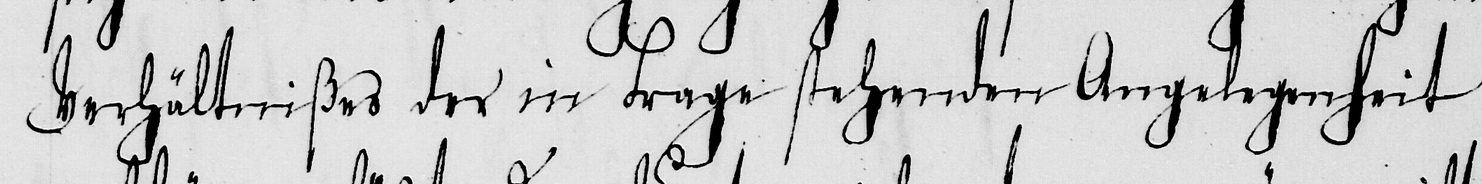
Verhältnißes der in Frage stehenden Angelegenheit
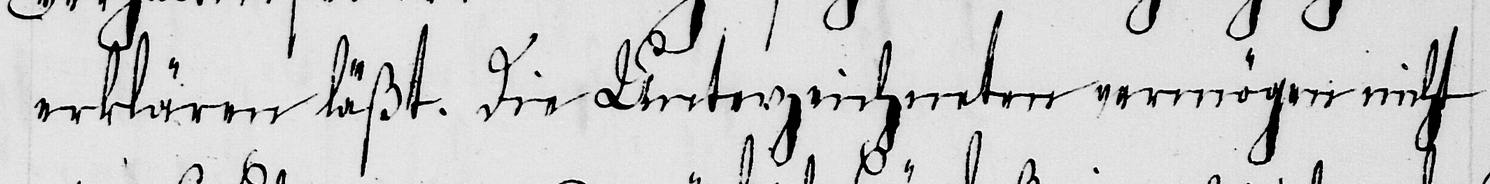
erklären läßt. Die Unterzeichneten vermögen nicht
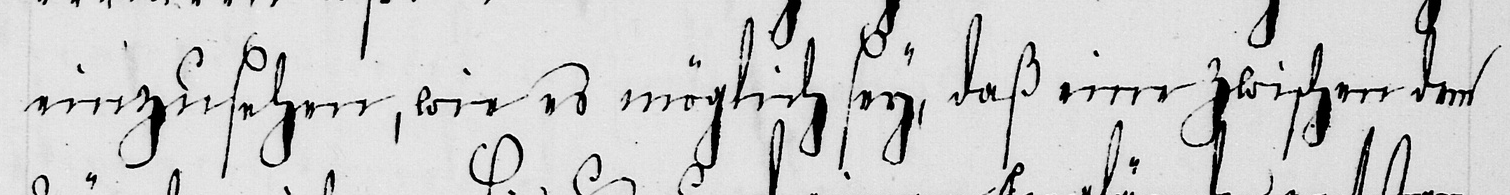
einzusehen, wie es möglich sey, daß eine zwischen dem
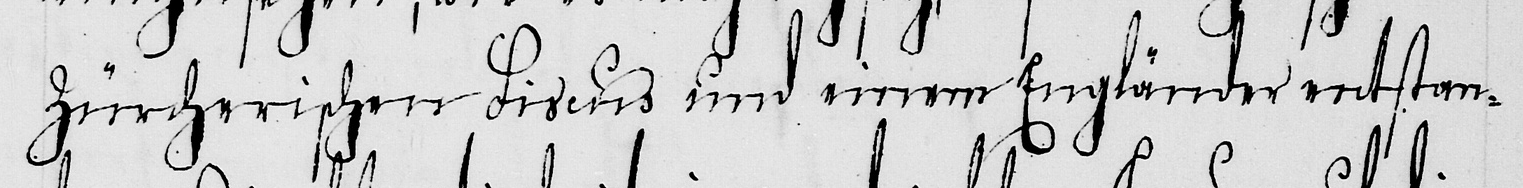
Zürcherischen Fiscus und einem Engländer entstan¬
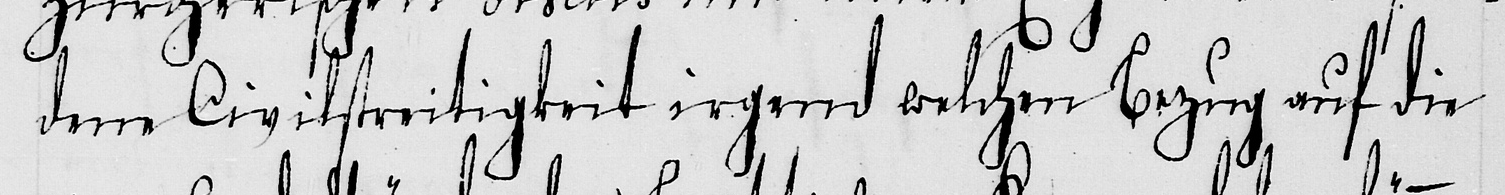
dene Civilstreitigkeit irgend welchen Bezug auf die
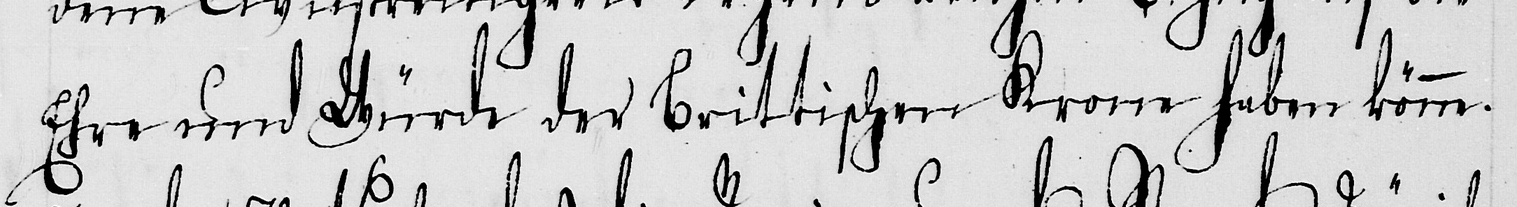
Ehre und Würde der Brittischen Krone haben könne.
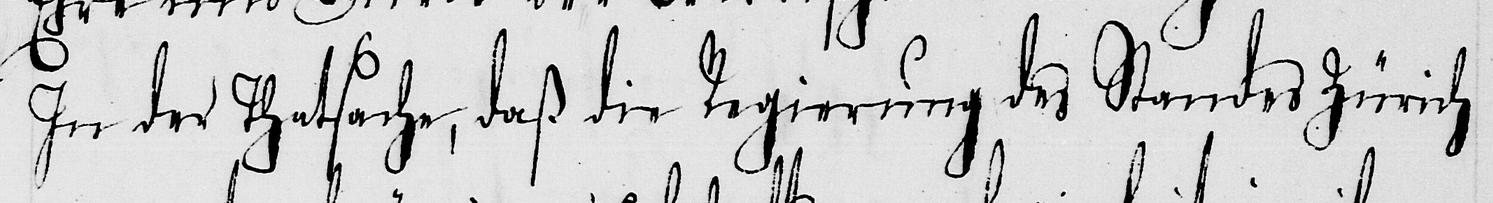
In der Thatsache, daß die Regierung des Standes Zürich
